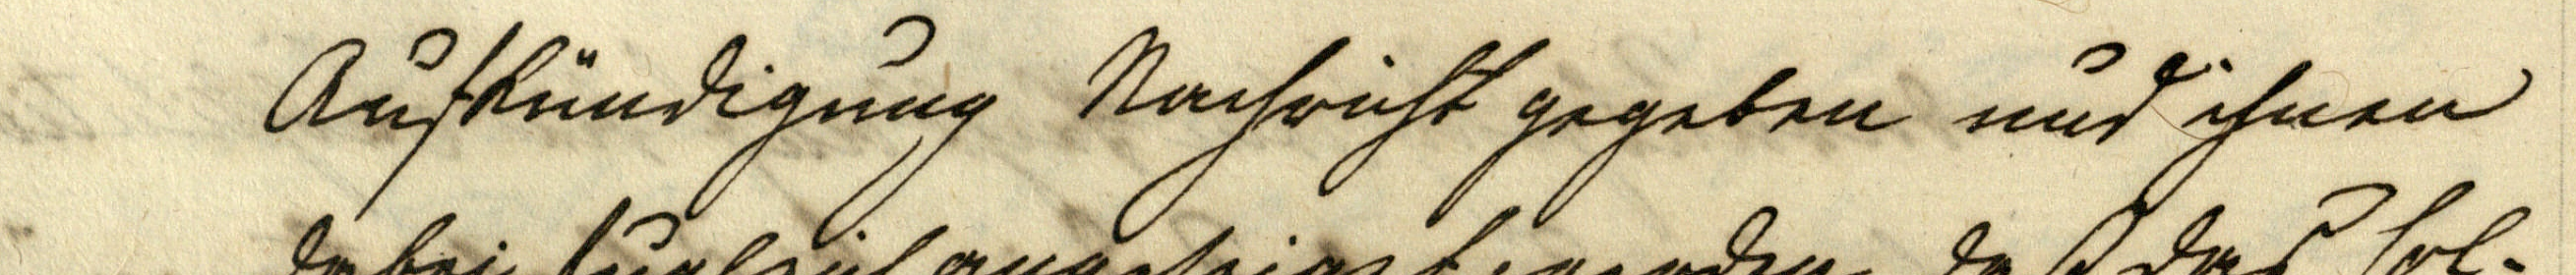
Aufkündigung Nachricht gegeben und ihnen
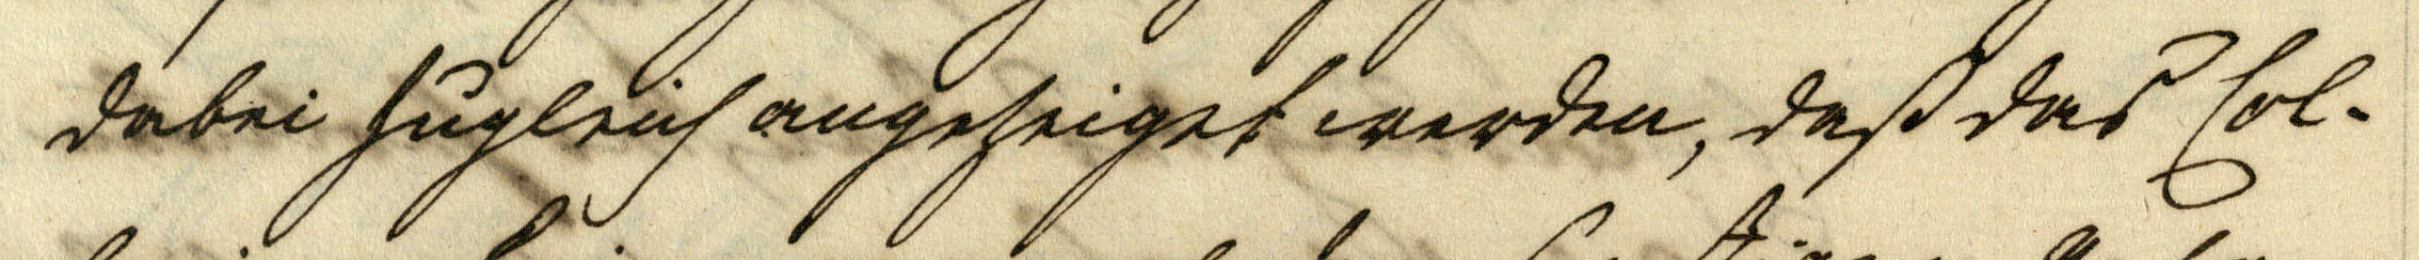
dabei zugleich angezeiget werden, daß das Col-
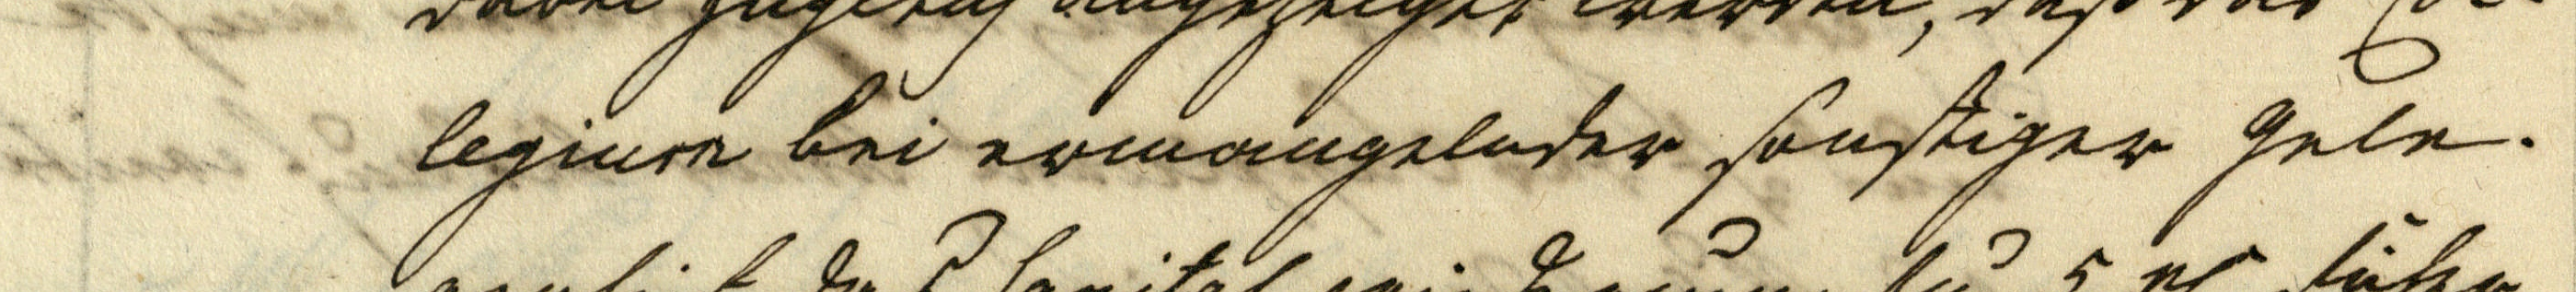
legium bei ermangelnder sonstiger Gele-
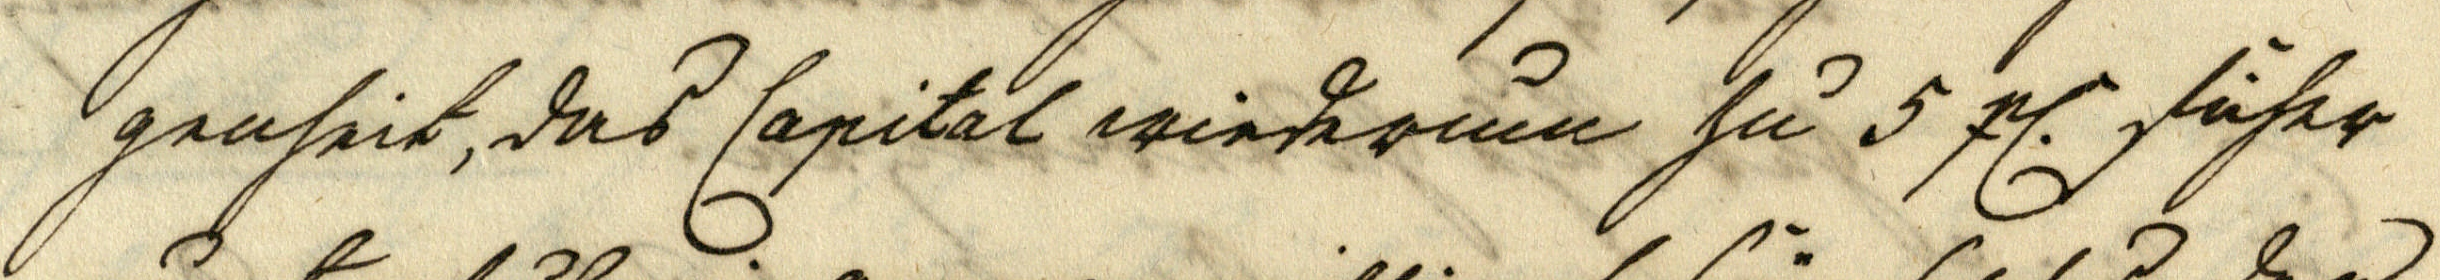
genheit, das Capital wiederum zu 5 pc sicher
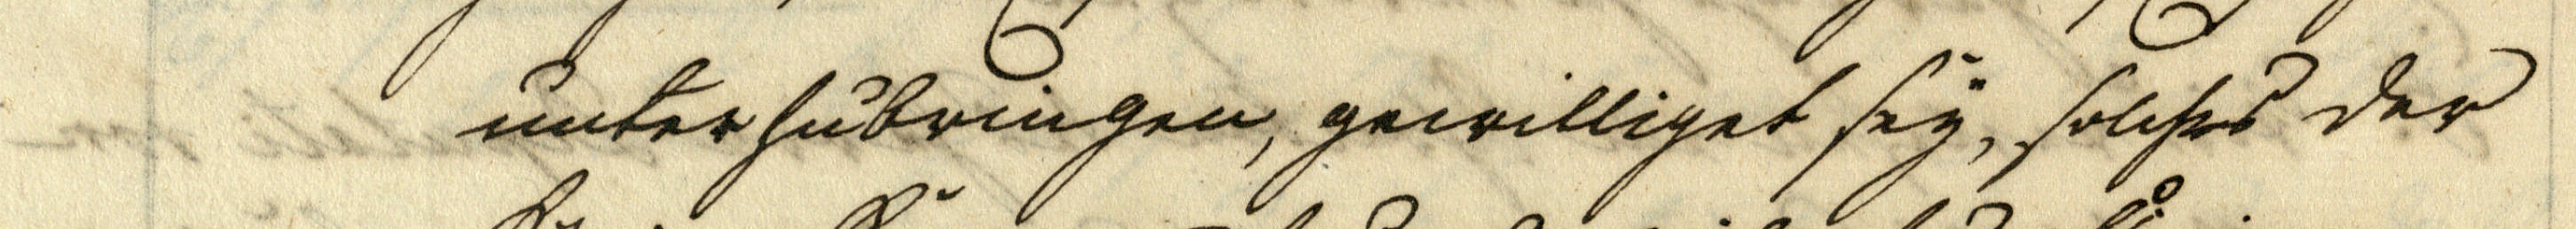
unterzubringen gewilliget sey, solches der
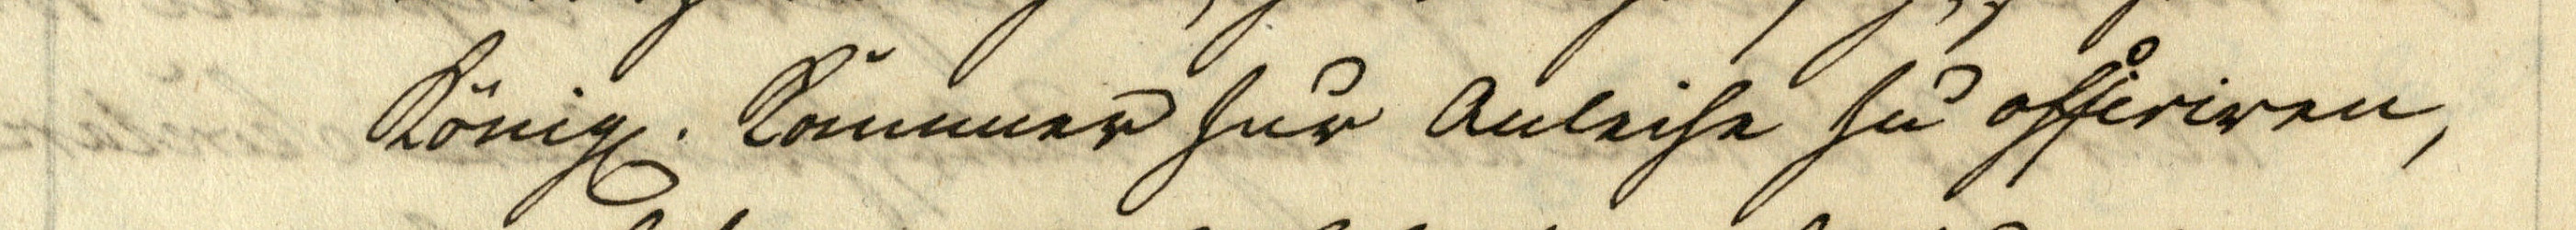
Königl. Kammer zur Anleihe zu offeriren,
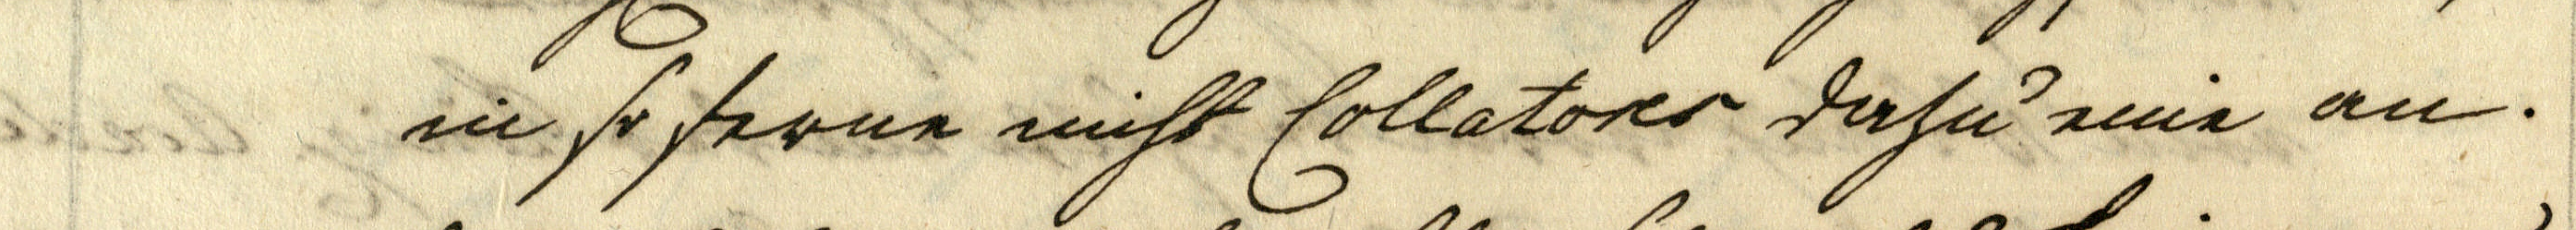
in so ferne nicht Collatores dazu eine an-
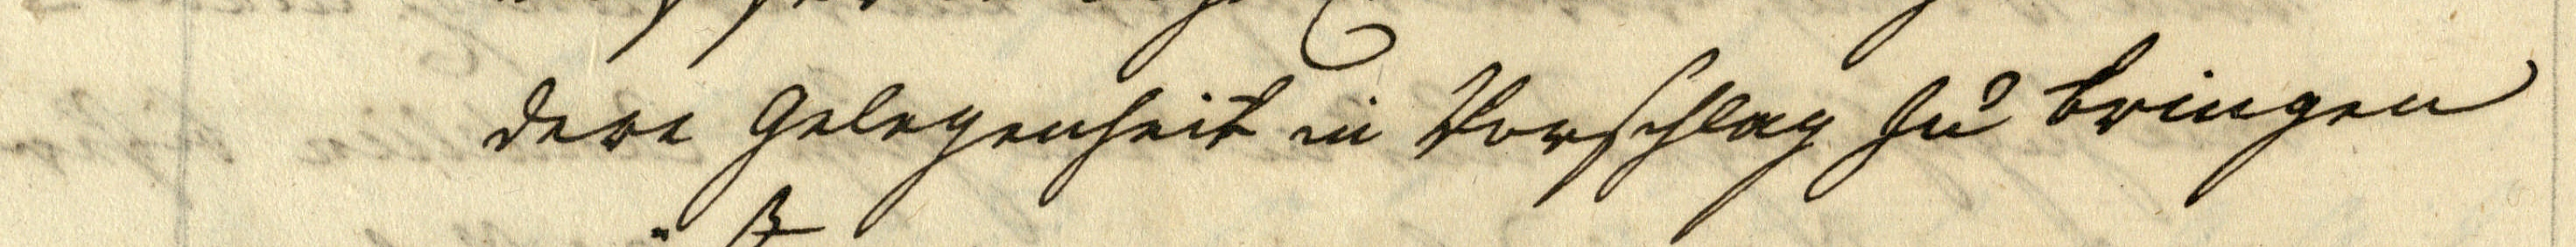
dere Gelegenheit in Vorschlag zu bringen
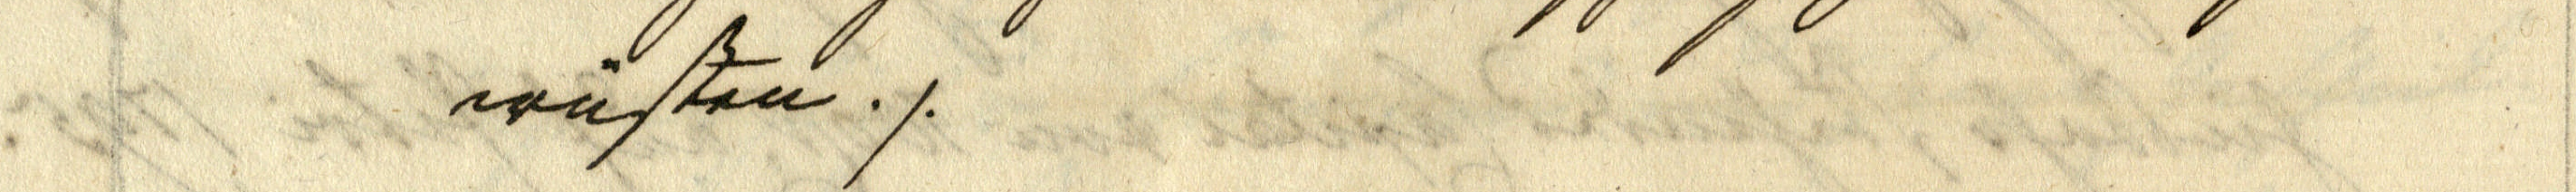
wüßten.
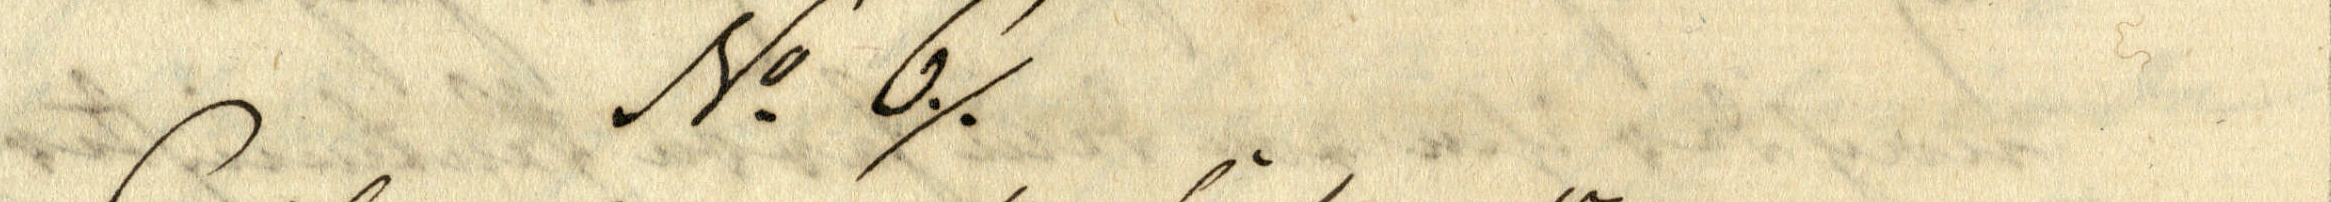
No. 6./.
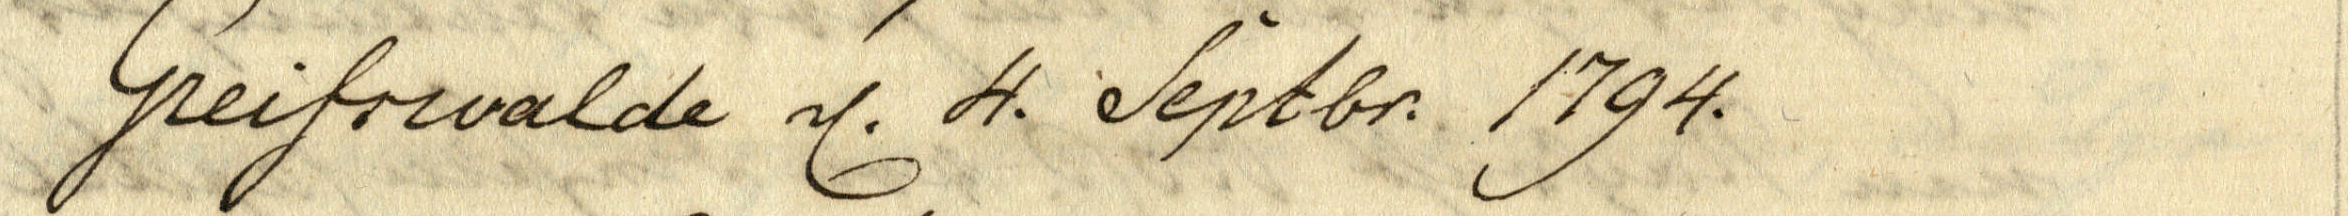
Greifswalde d. 4. Septbr. 1794
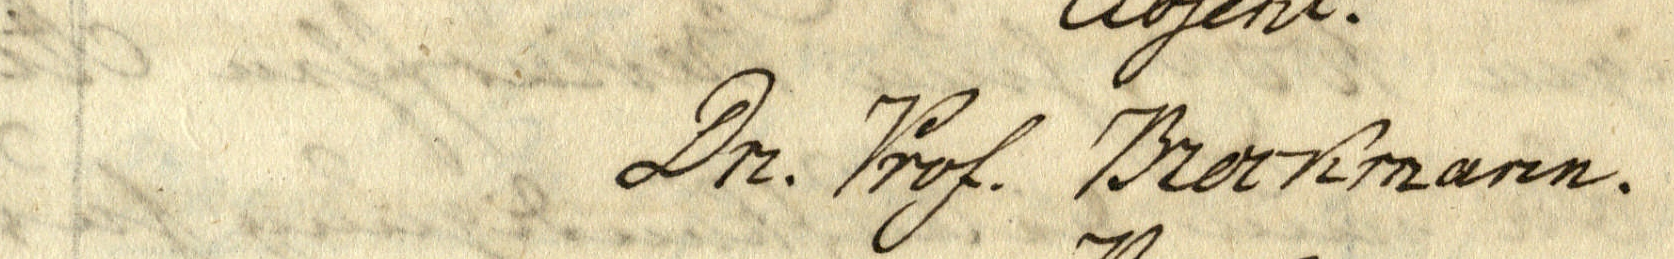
Dn. Prof. Brockmann.
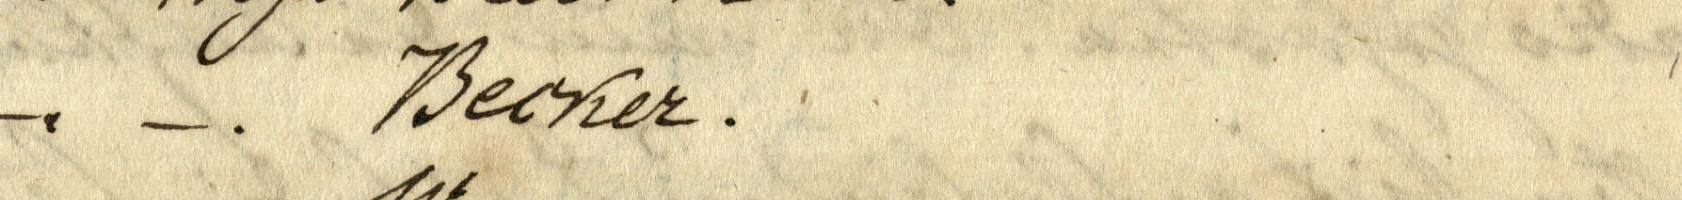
- " - " Becker.
